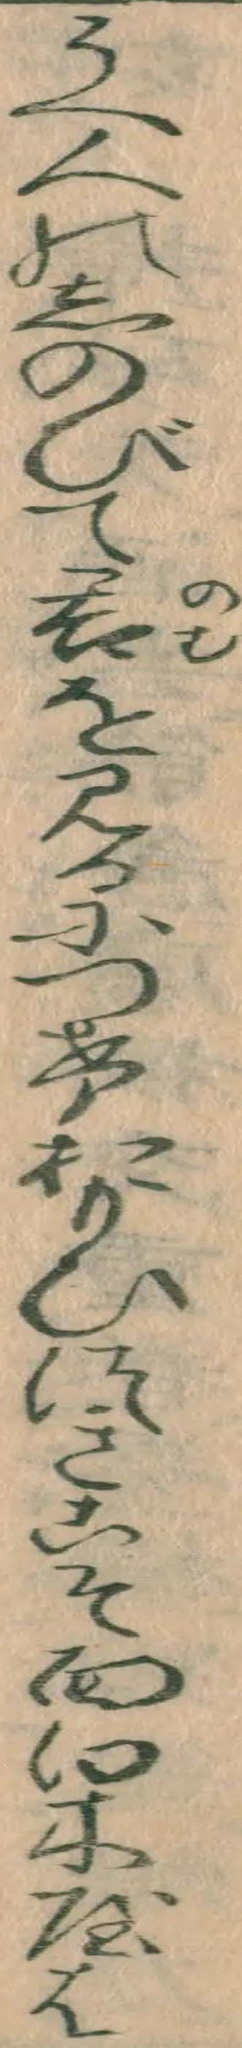うへ人のしのびて呑を見るにつけおもひつきこそ面白きやは
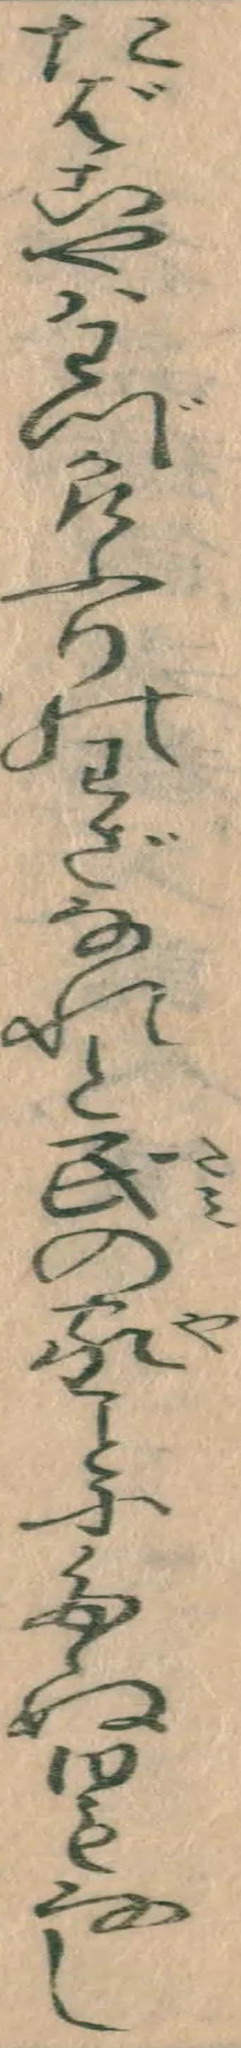たばこやはわづかけふりのわざなれと民の家ことにたゝぬ日もなし
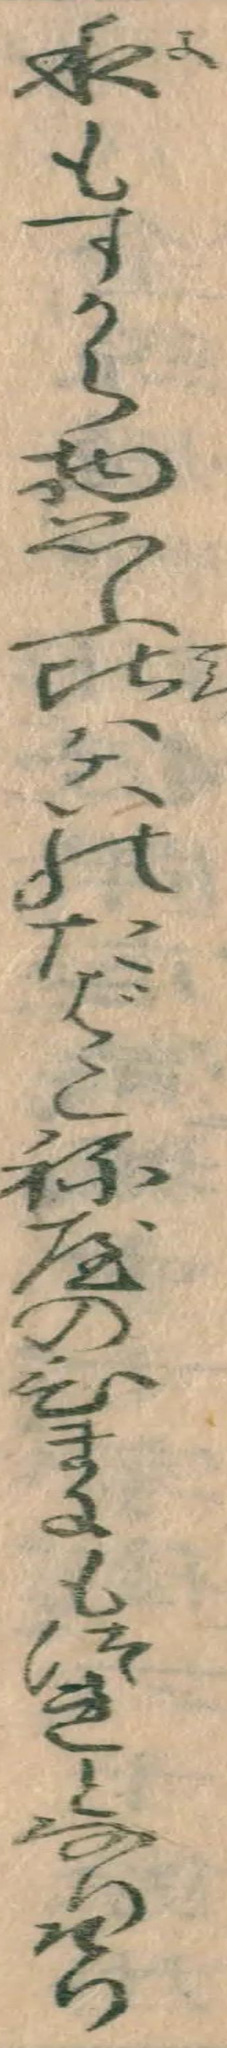夜もすから物思ふ比はこのたばこねやのひまにもつれとなりけり
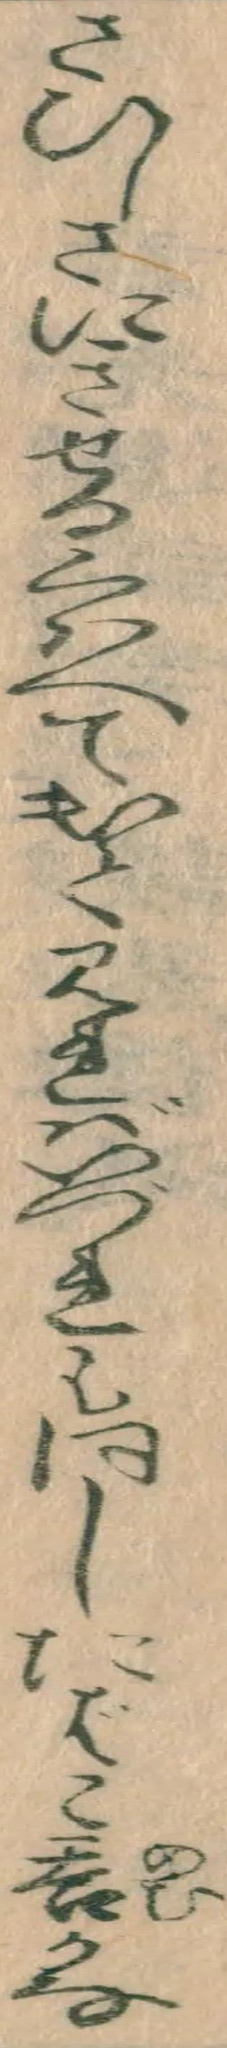さひしさにきせるくはへて出て見ればいづれも同したばこ呑かな
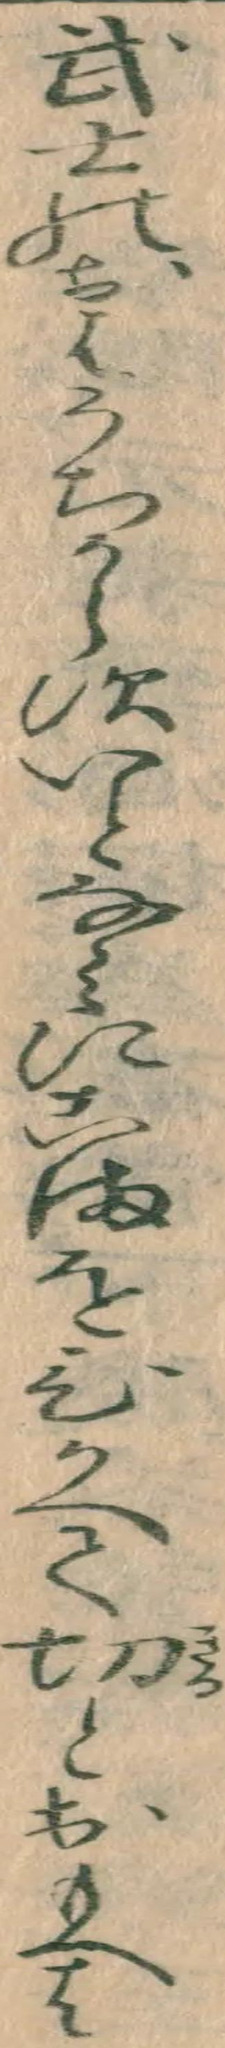武士のおはうちからすいとなみにこまをひかへて切とおもへは
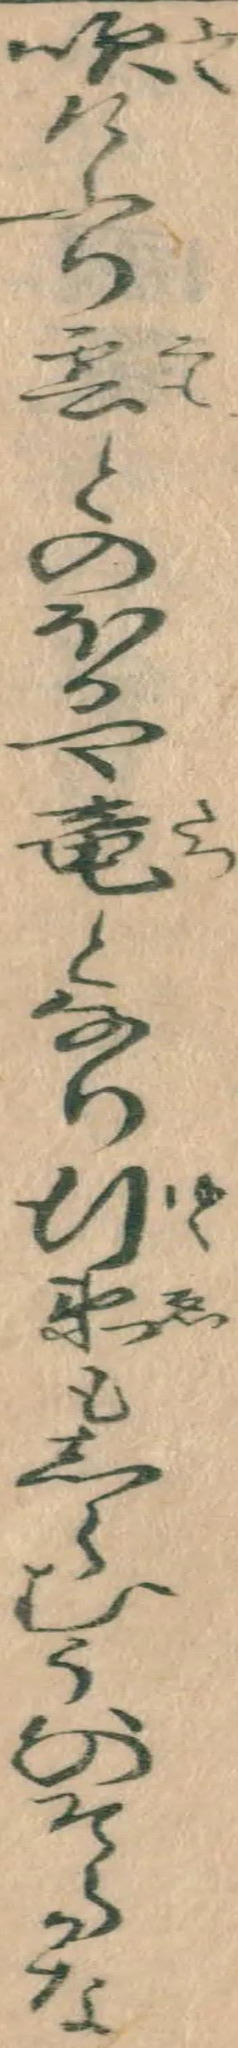吹けふり雲とのほるや竜となり行衛もしらむうはのそらかな
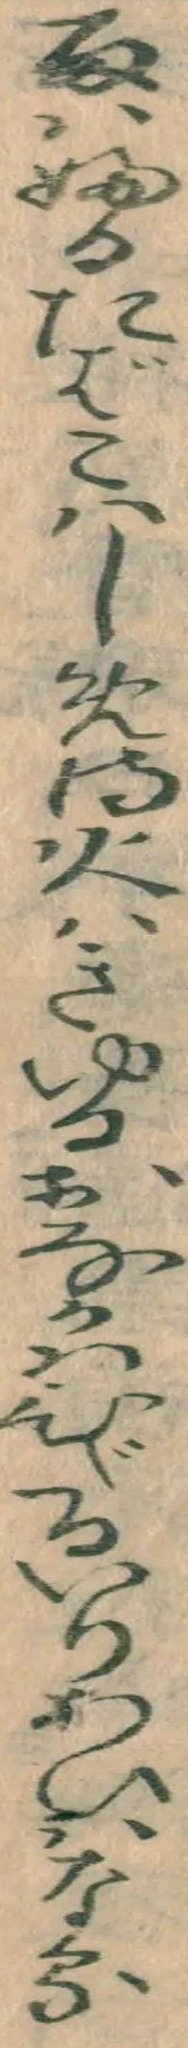雨はふるたばこはしめる火はきゆるおなかはひだるいりあひはなる
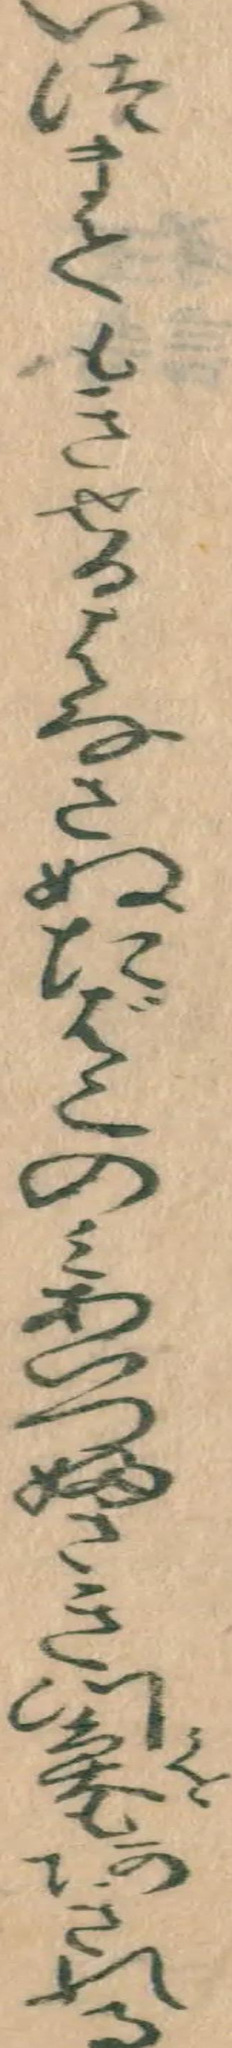いつまてもきせるはなさぬたばこのみあいつふさきつ魚もあきれる

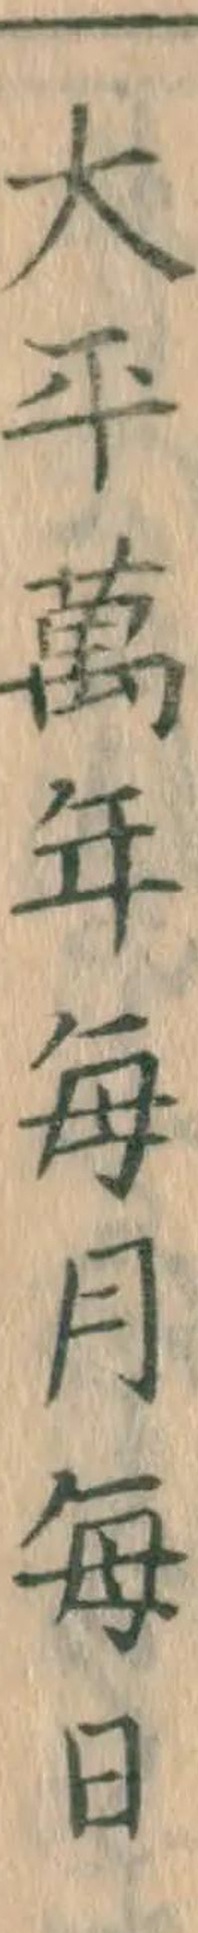太平万年毎月毎日

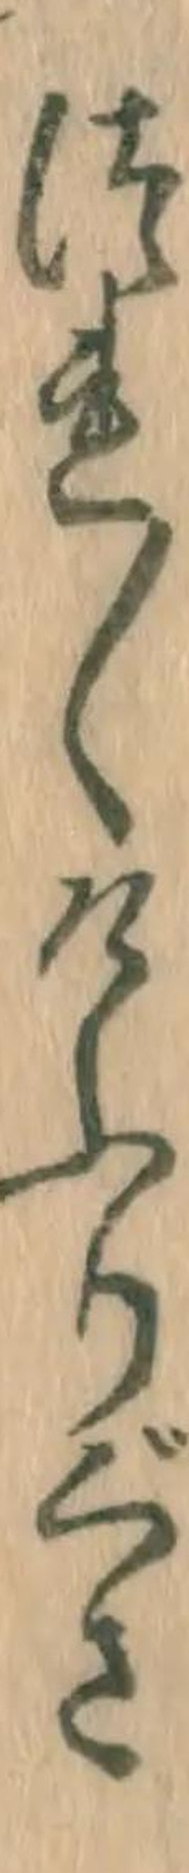つれ〳〵けふりぐさ
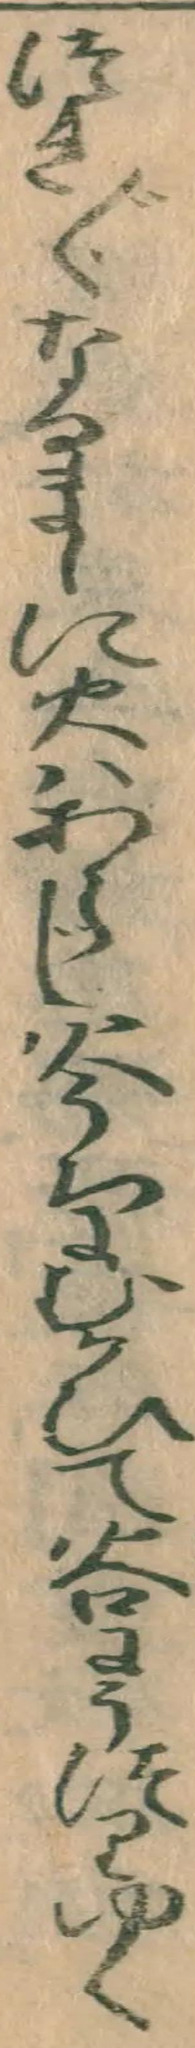つれ〴〵なるまゝに火はあらじ火うちにむかひて火口にうつりゆく
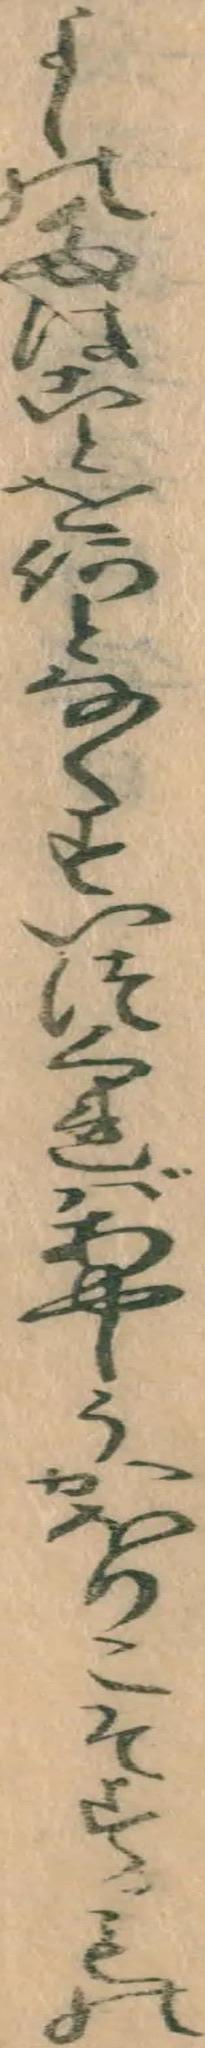よしのたはことを何となくすいつくればあやしうかほりこそするもの
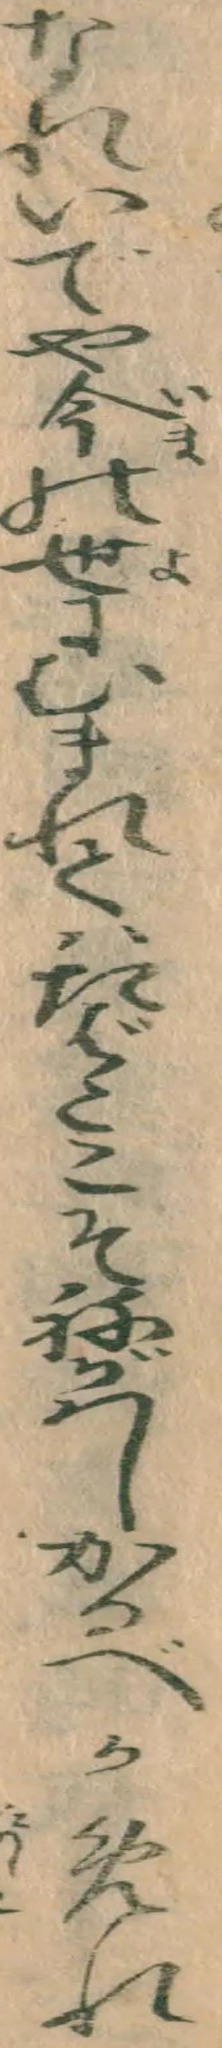なれいでや今の世にむまれてはたばここそねがはしかるべかめれ
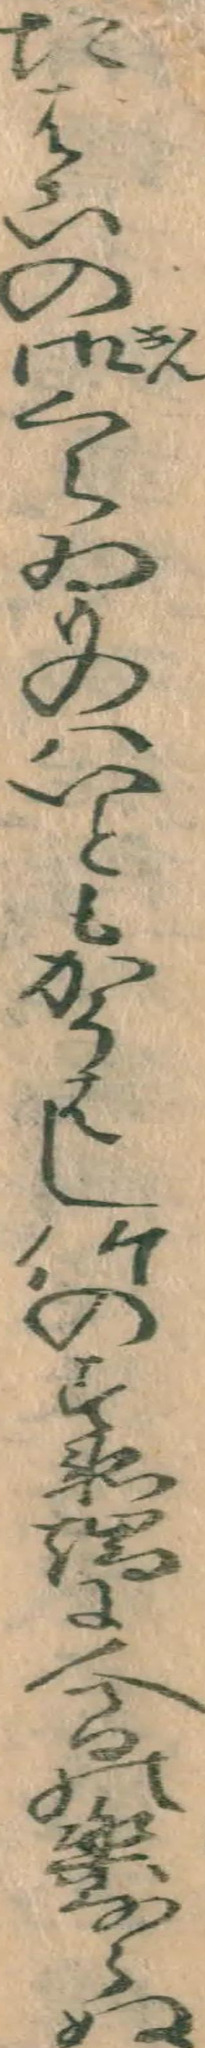たはこの御くらゐものはいともかうはし竹のすゑ端に人間の楽ならぬ
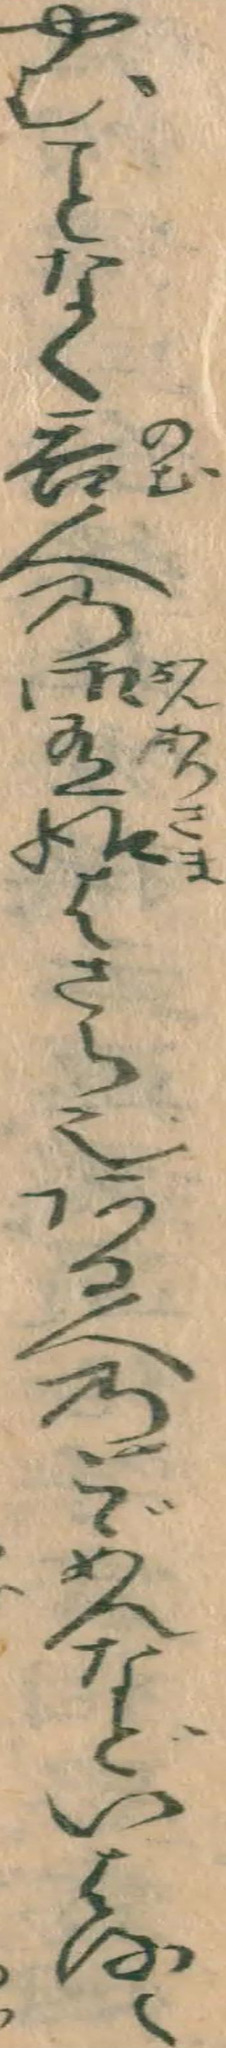やむことなく呑人の御有様はさら也ある人のとゞめんなどいはるゝ
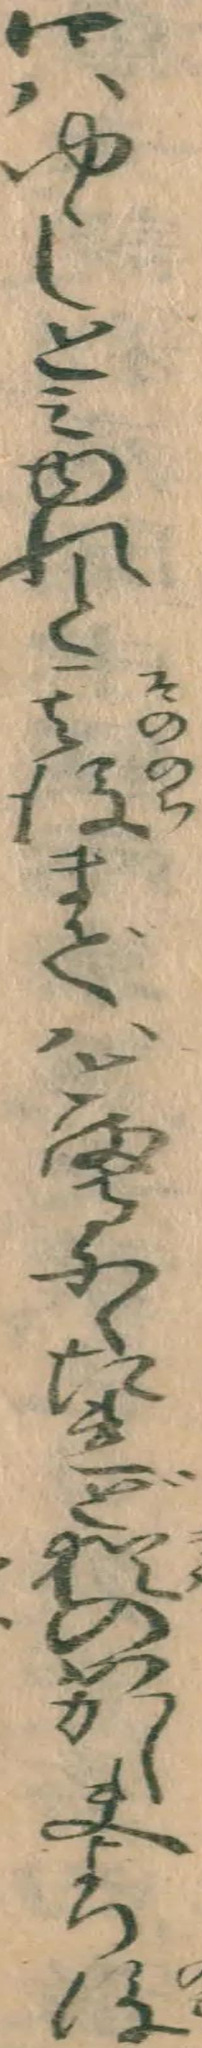口はゆゝしとみゆれと其後まではとまるにゝたれど猶の如かし夫より後
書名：煙草記
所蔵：国立国会図書館 National Diet Library, JAPAN
